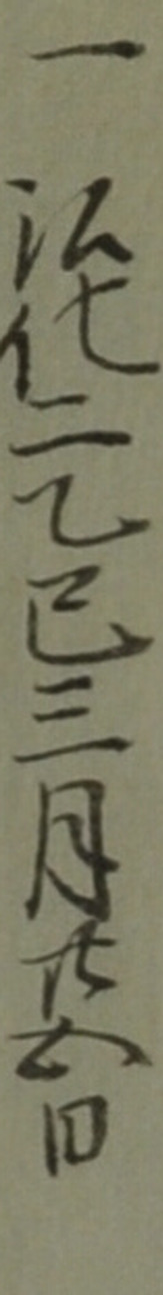一弘化二乙巳三月廿五日
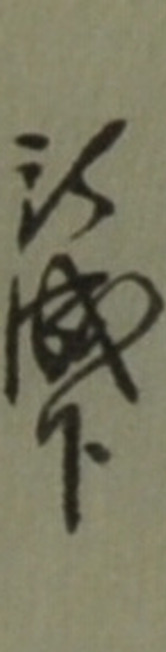被成下
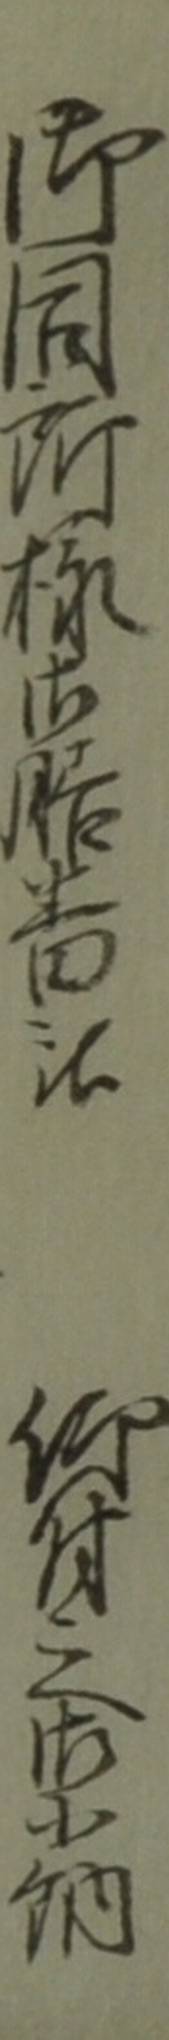一御同所様膳番被仰付之御小納
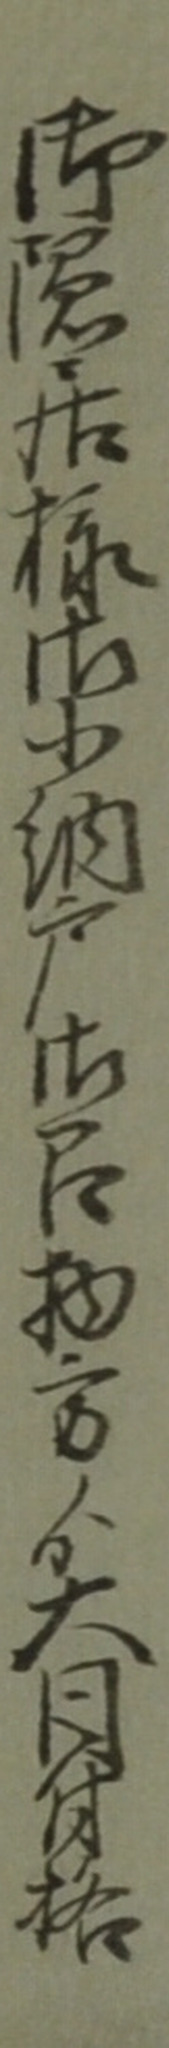御隠居様御小納戸御召物方ゟ大目付格
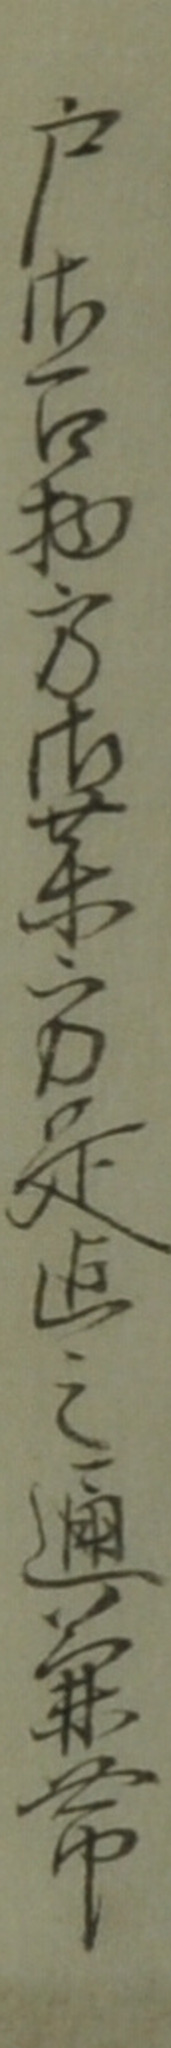戸御召物方御薬方是迄之通兼帯

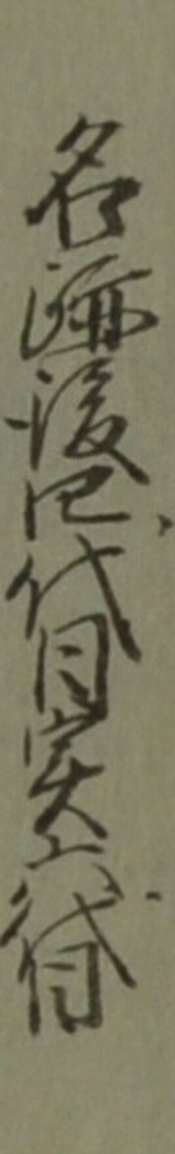名跡後四代目実六代目
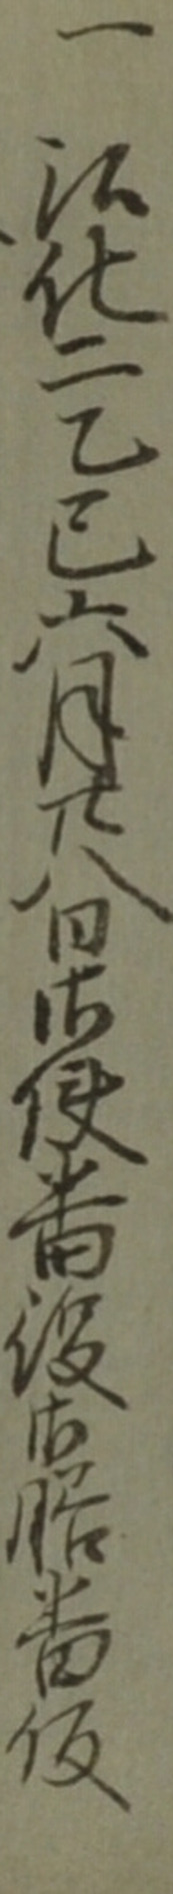一弘化二乙巳六月廿八日御使番役御膳番仮
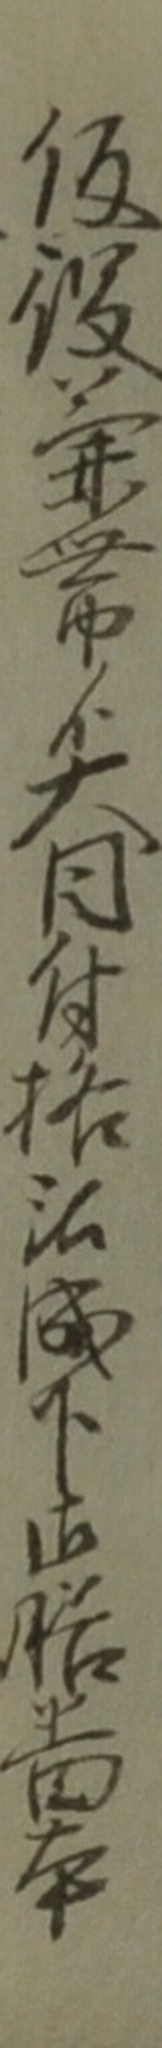仮役兼帯ゟ大目付格被成下御膳番本
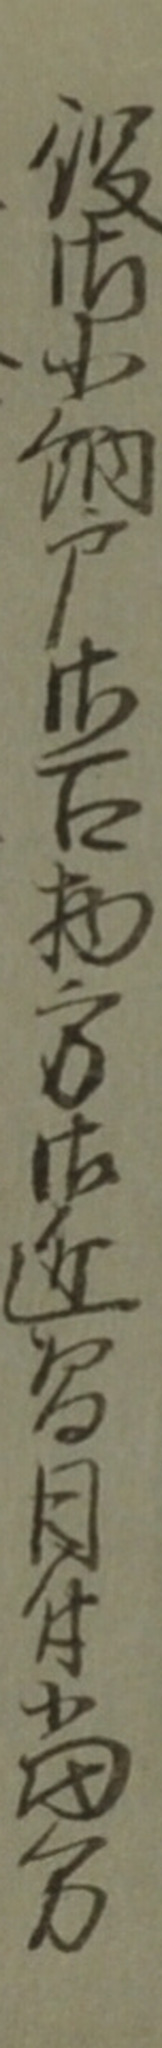役御小納戸御召物方御近習目付当分
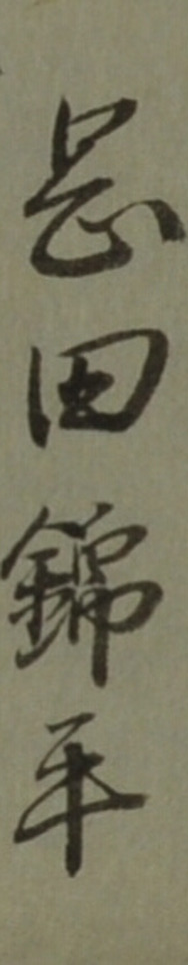岡田錦平
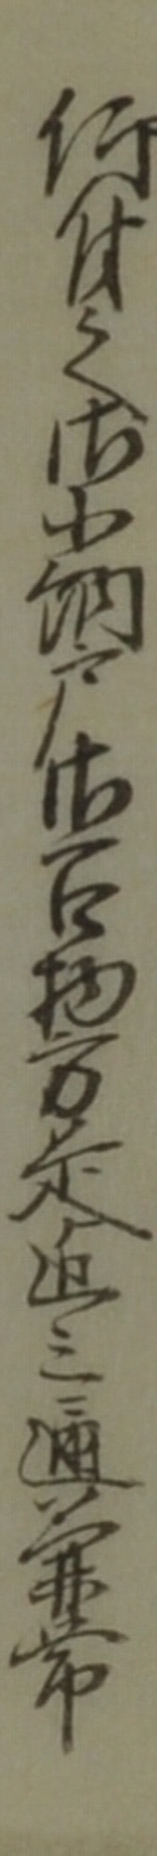仰付之御小納戸御召物是迄之通兼帯
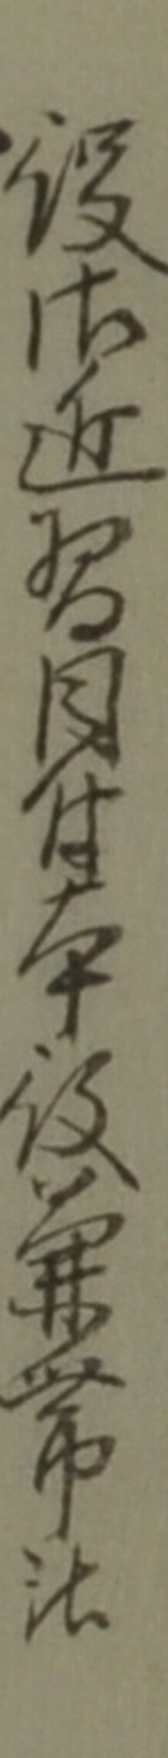役御近習目付本役兼帯被
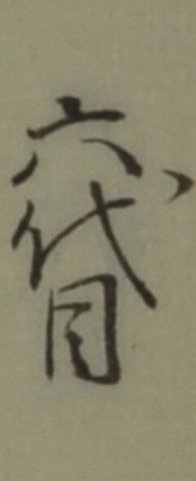六代目
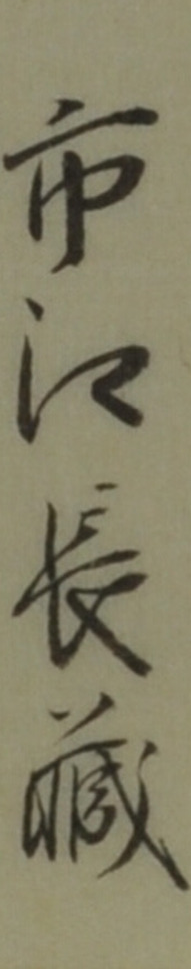市江長蔵
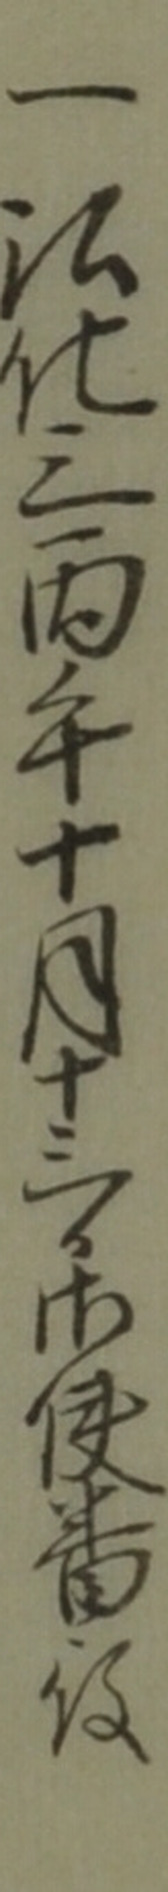一弘化三丙午十月十三日御使番役
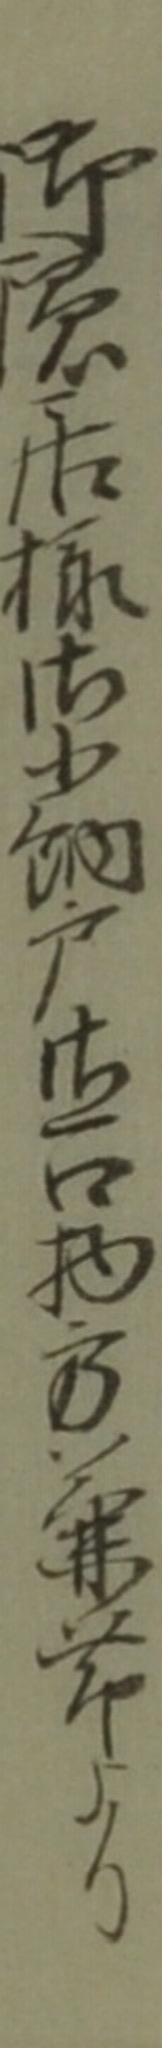御隠居様御小納戸御召物方兼帯より
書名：諸御役代々録（四）
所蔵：伊那市立高遠町図書館・合同会社AMANE
